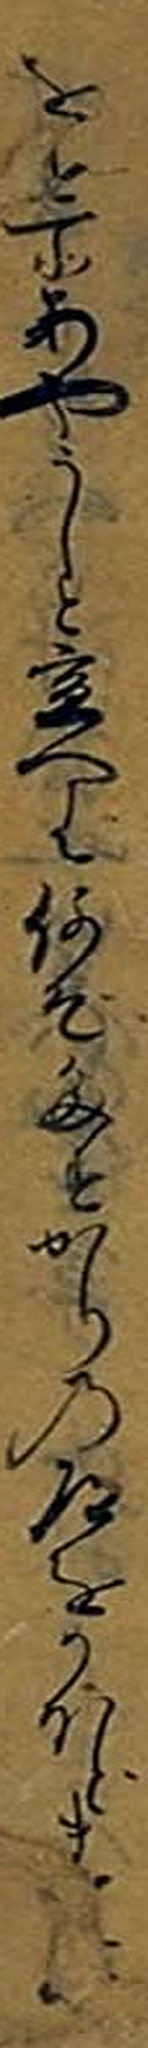を所あやうしと宣へば何ぞたすかりの道をかほどまて
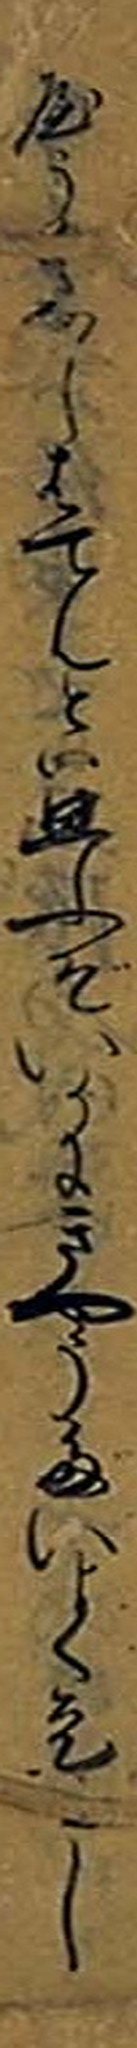やうしはてんとは思ふぞいかにきやうだいよく是し
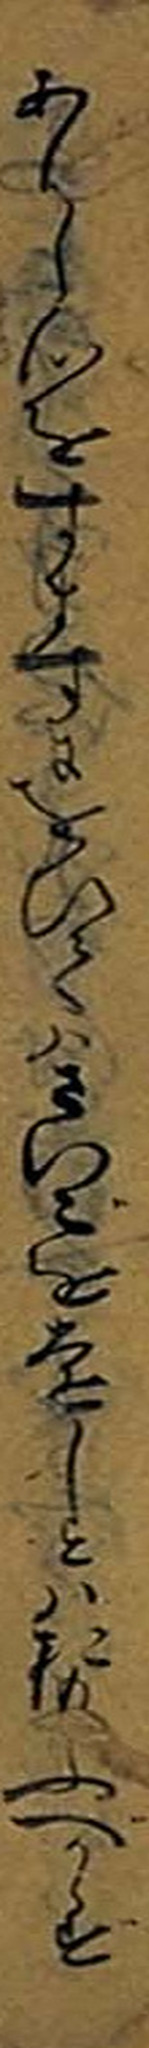あんし心をすますにをひてはさいごを遠しとはおもふべからず
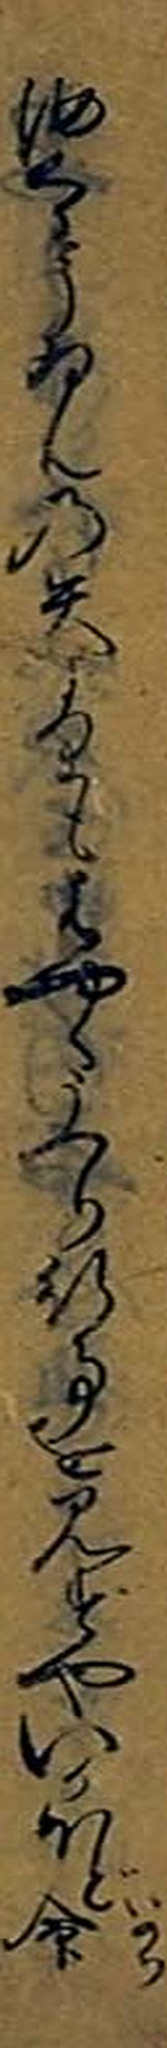汝くわうゐんの矢よりもはやくうつり行事を見ずやいかほど命
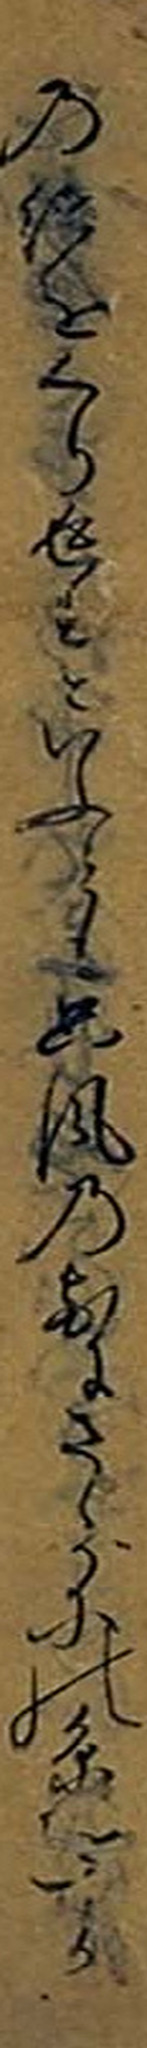の緒をくり返すといふとも只風の前にさゝがにの糸
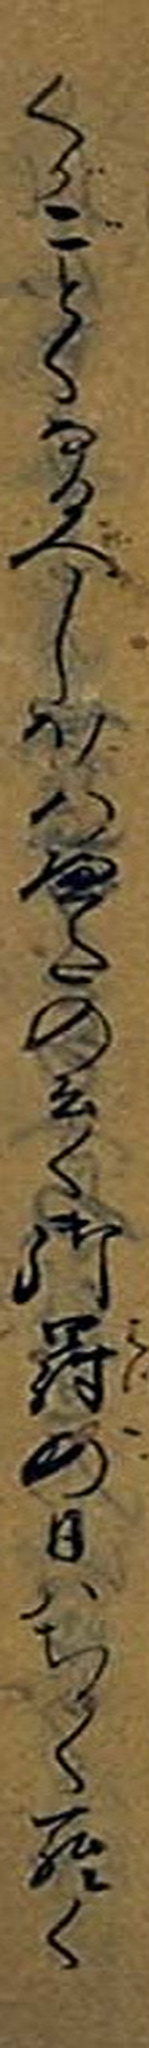くがごとくなるべしへたの云く御罰の日はちかくらく
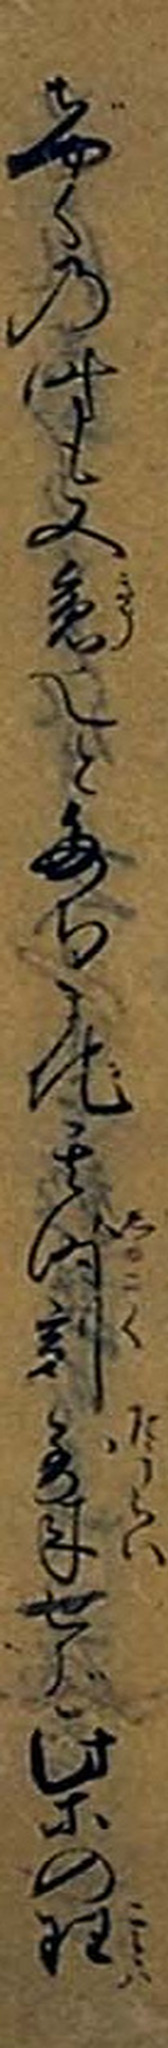ぢやくの時も又急也とたちまち其時刻到来せば此等の理

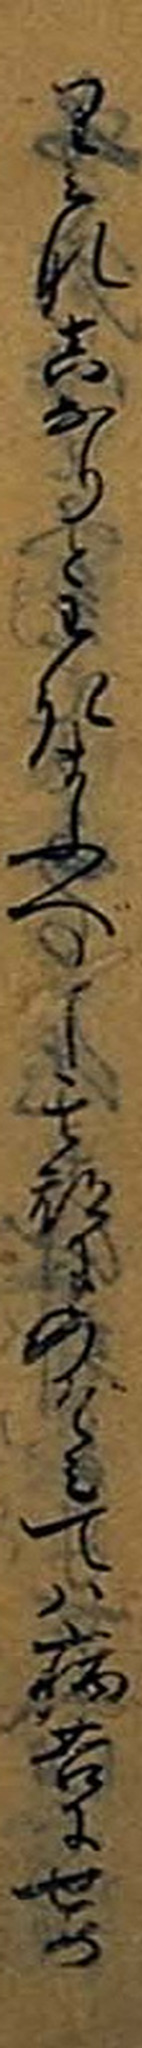りみな真なりとわきまふべし其期にのぞみては病苦にせめ
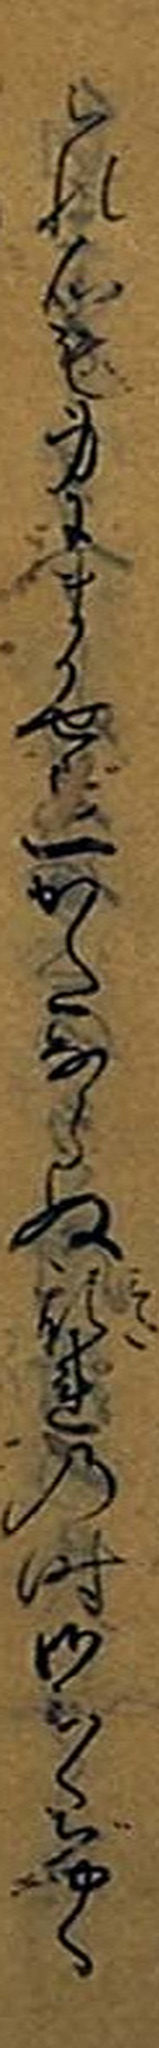られ心も身にまかせ一かたならぬ乱れの時御らくぢやく
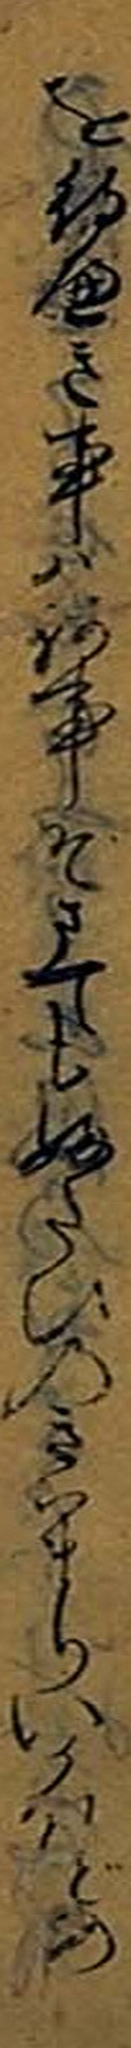を待べき事は何事ぞさてもふたひのきはまりいかどの
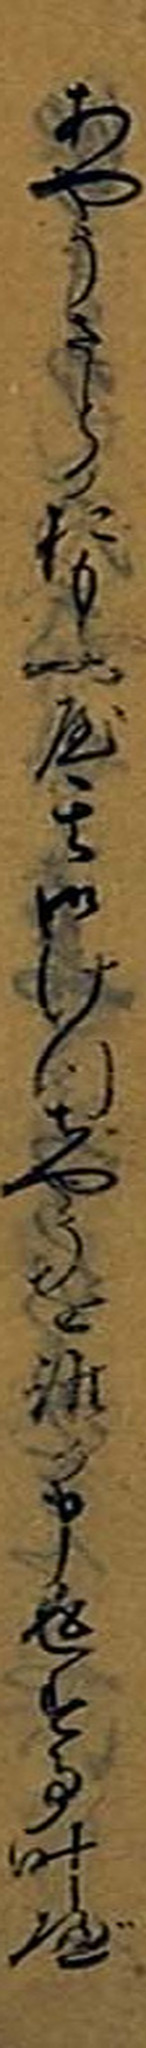あやうさとかおもふや其御けつぢやうを誰か申返す事叶べ
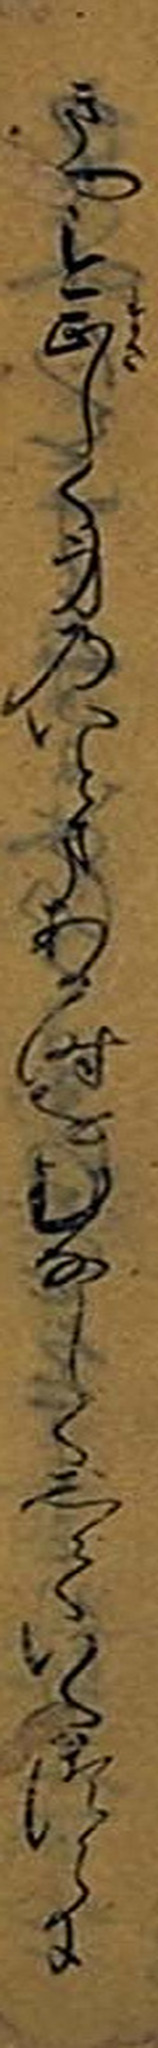きや今正しく身のいとまある時をむなしくしていたつらに
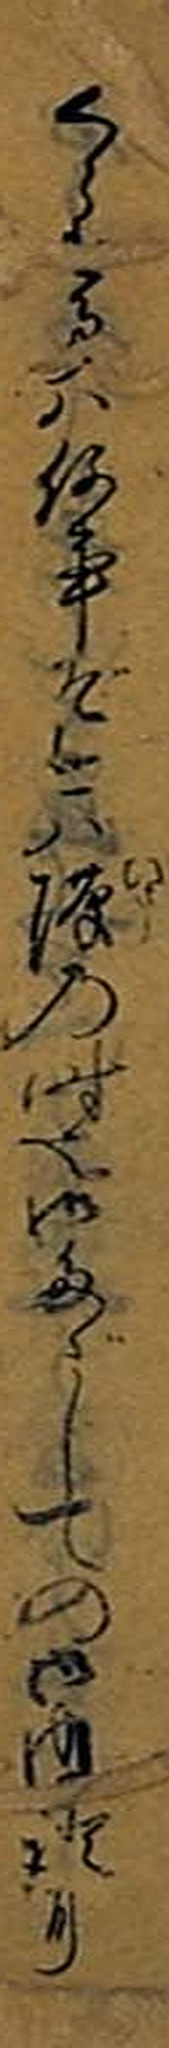くら事は何事ぞ今は隙の時也御たゞしての御内証に
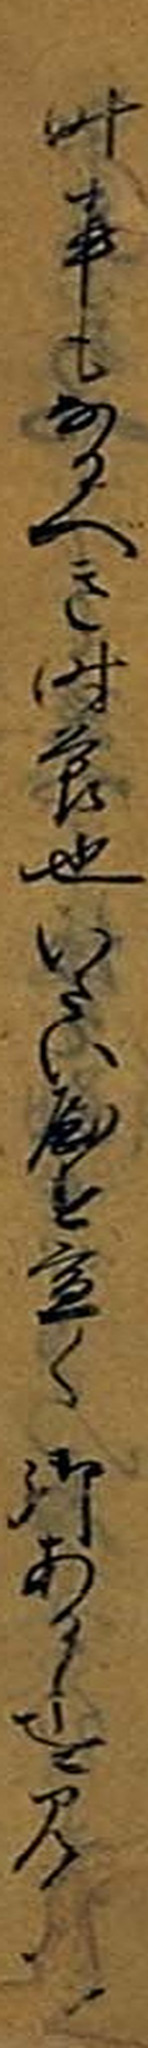叶事もなるべき時節也いさいやす宣く御あるしを見
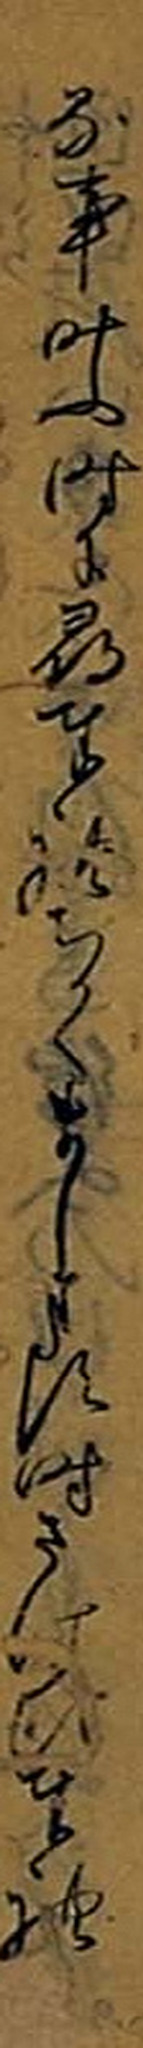る事叶ふ時に尋奉れちかくまします時さけび奉れ
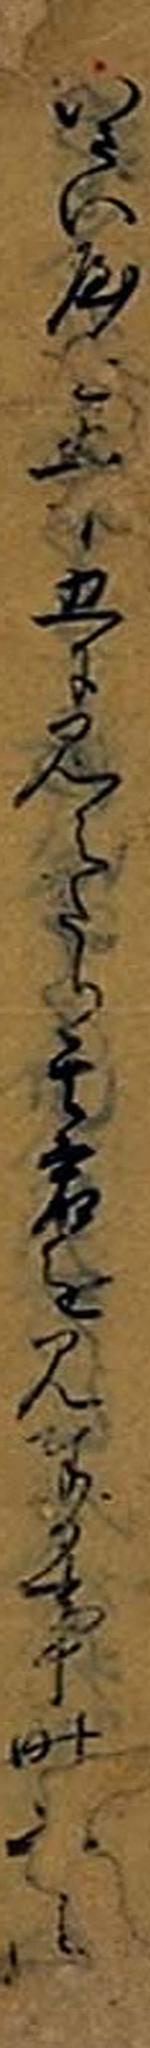•いさいや五に見えたり其君を見奉る事叶と
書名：ぎやどぺかどる
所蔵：東京大学総合図書館 / General Library in the University of Tokyo
